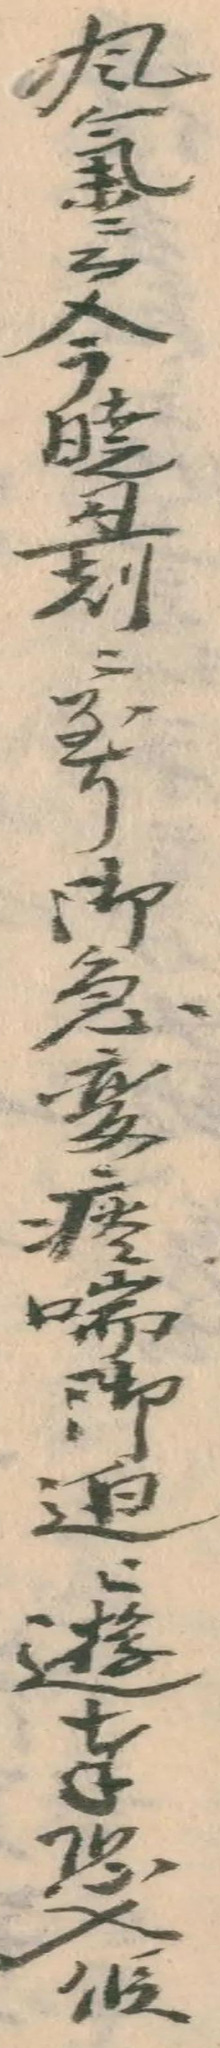風氣ニ而今暁丑刻ニ至り御急変痰喘御迫被遊奉恐入候
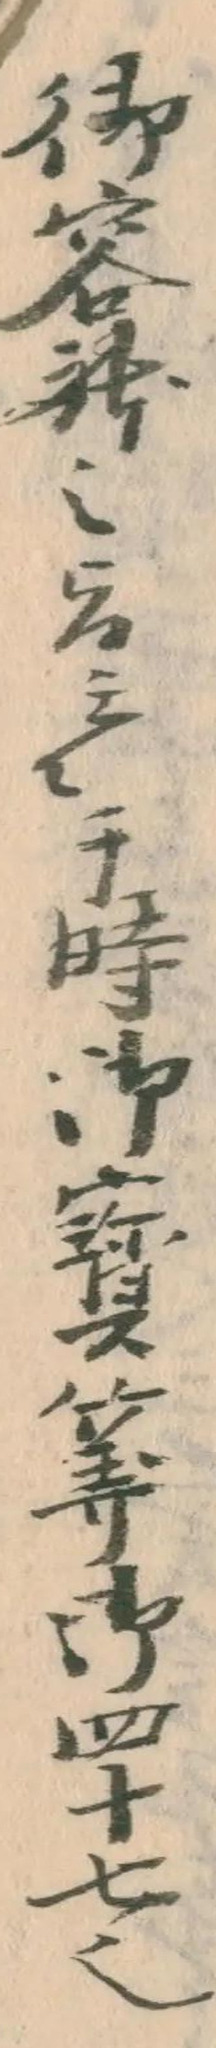御容躰之旨云々于時御寶算御四十七也
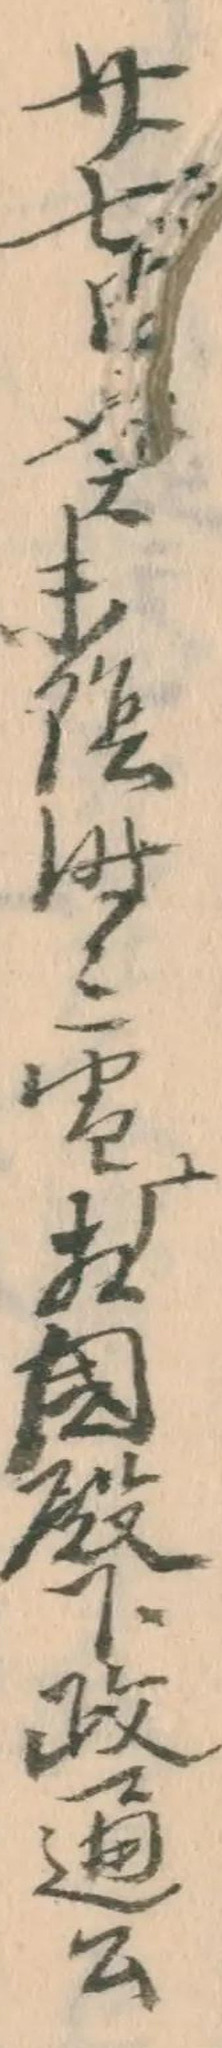廿七日癸未陰時々雪相國殿下政通公
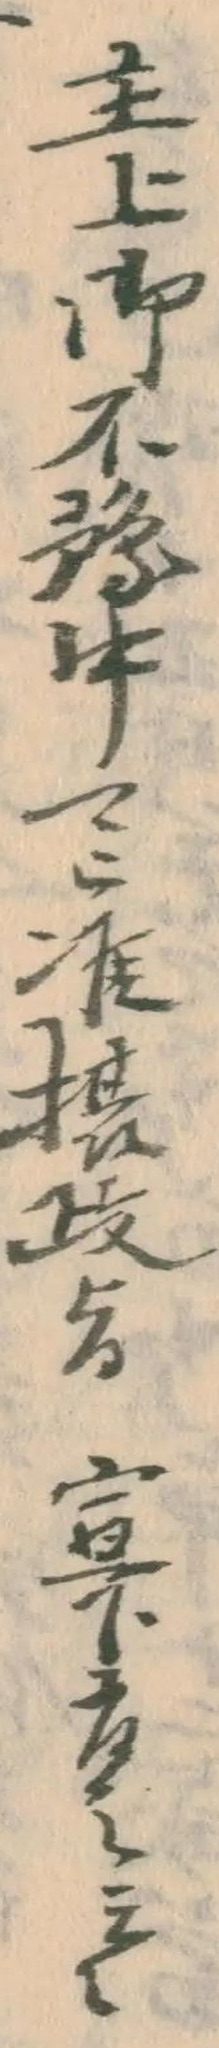主上御不豫中可被准摂政旨宣下有之云々
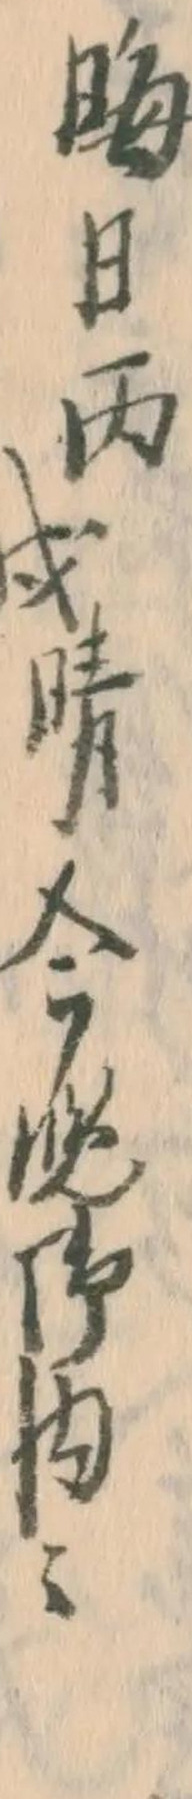晦日丙戌晴又被晩御内々
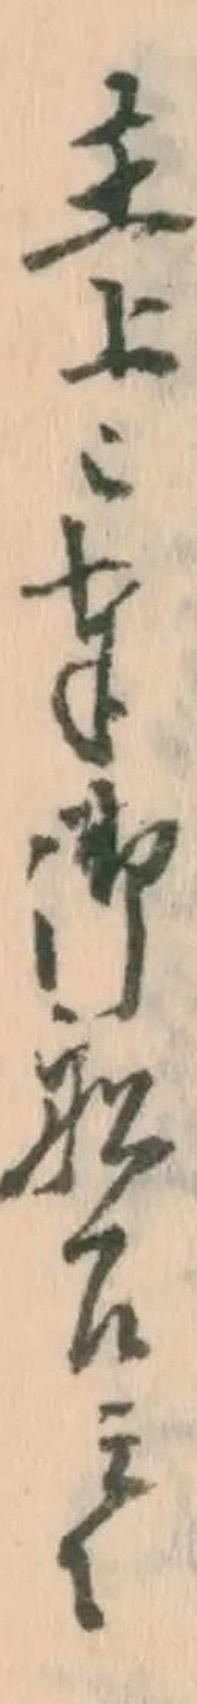主上被奉御船召云々
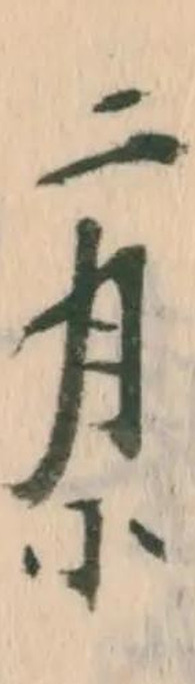二月小
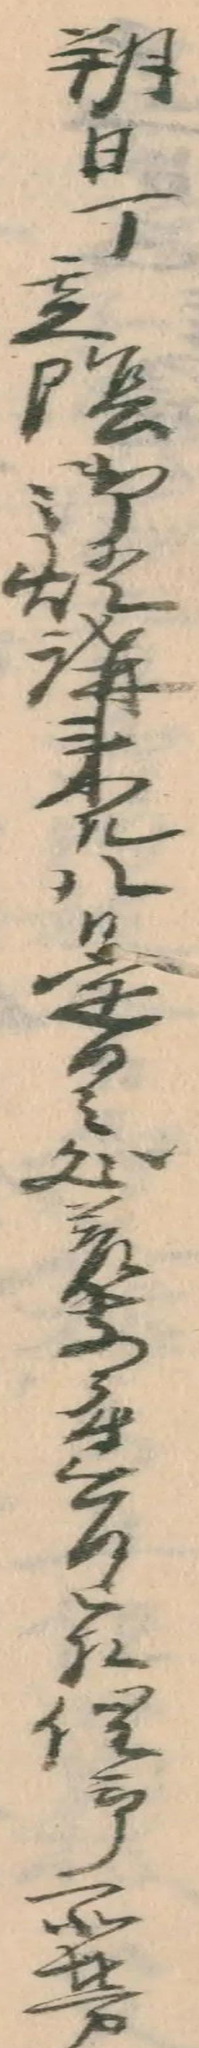朔日丁亥陰御燈講来ル八日定日之処差支ニ付今日被為催予所労
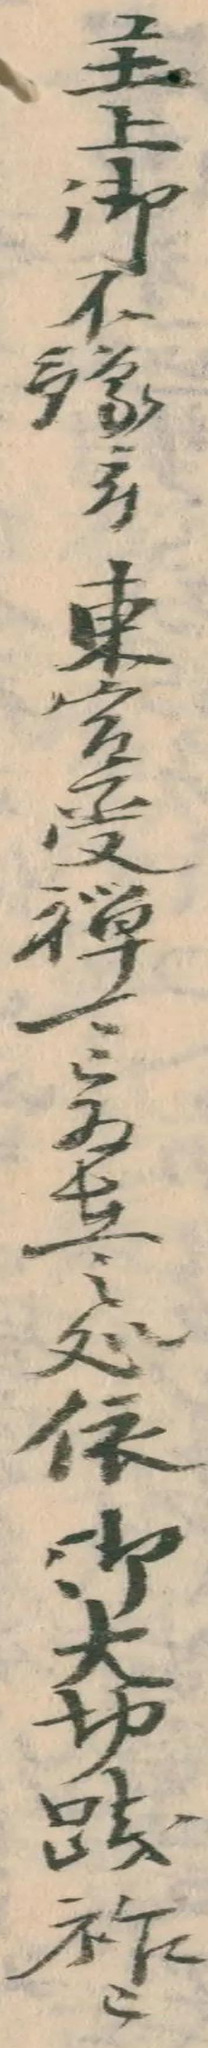主上御不豫ニ付東宮受禅可被為在之処依御大切践祚被
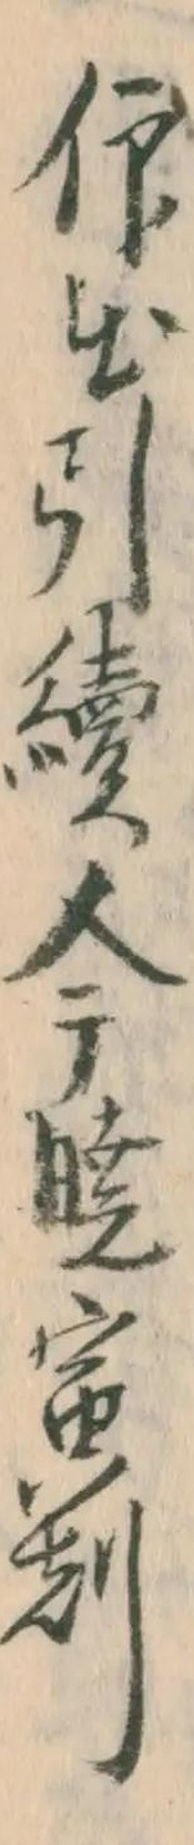仰出引續今暁寅刻
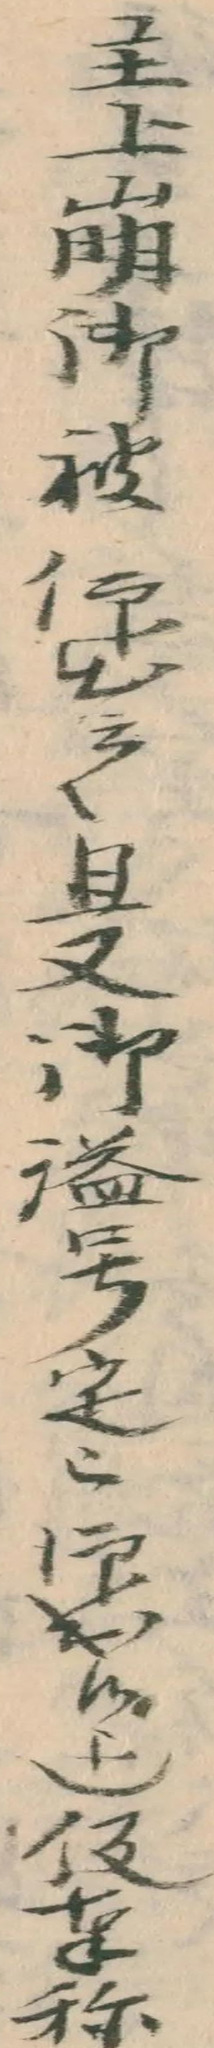主上崩御被仰出云々且又御諡号定被仰出候迄仮奉称
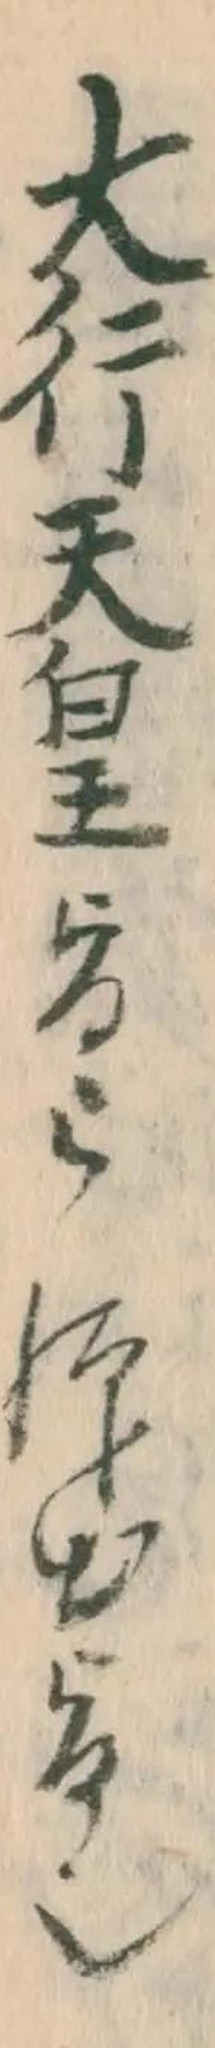大行天皇旨被仰出旨也
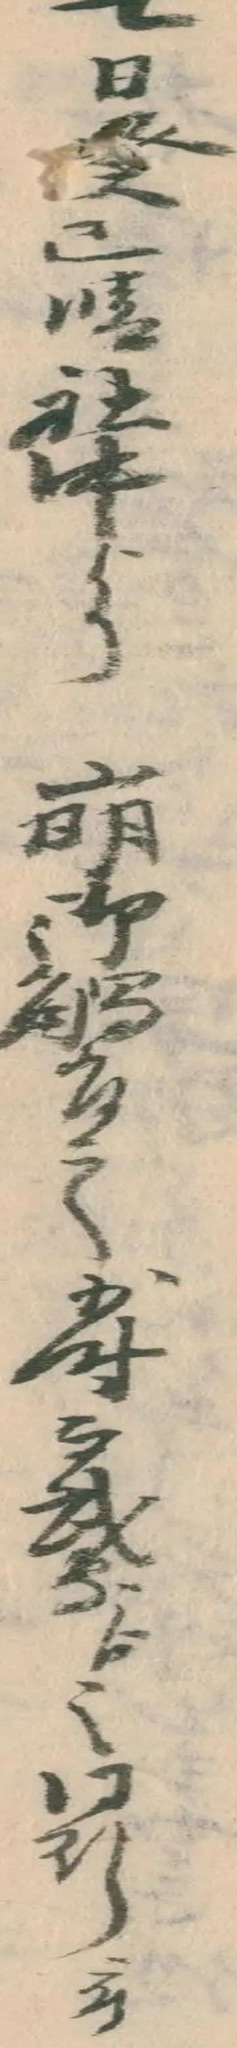七日癸巳晴社中より崩御觸有之少時而武家ゟ之同断ニ付
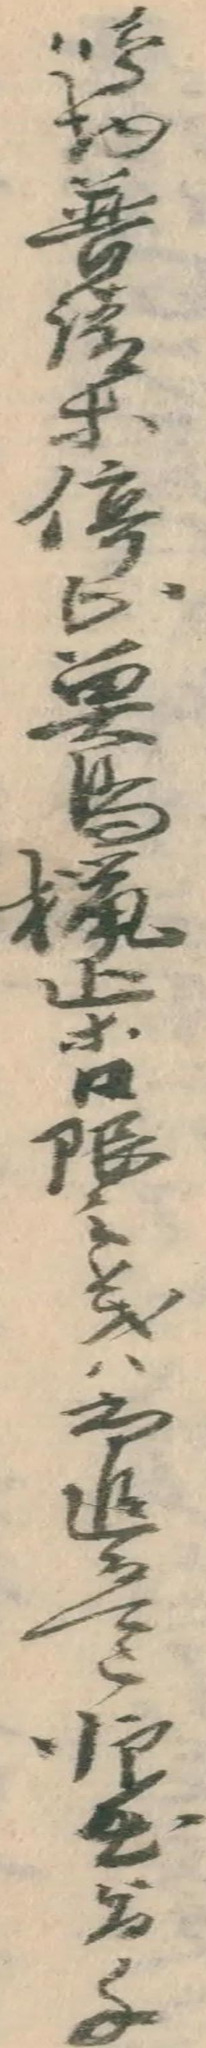鳴物普請等停止魚鳥猟止等日限之義ハ尚追而可被仰出旨千
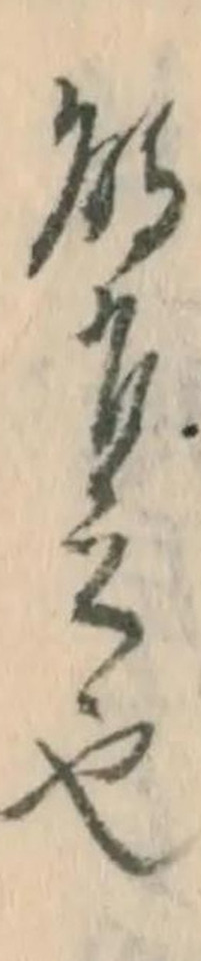觸有之也
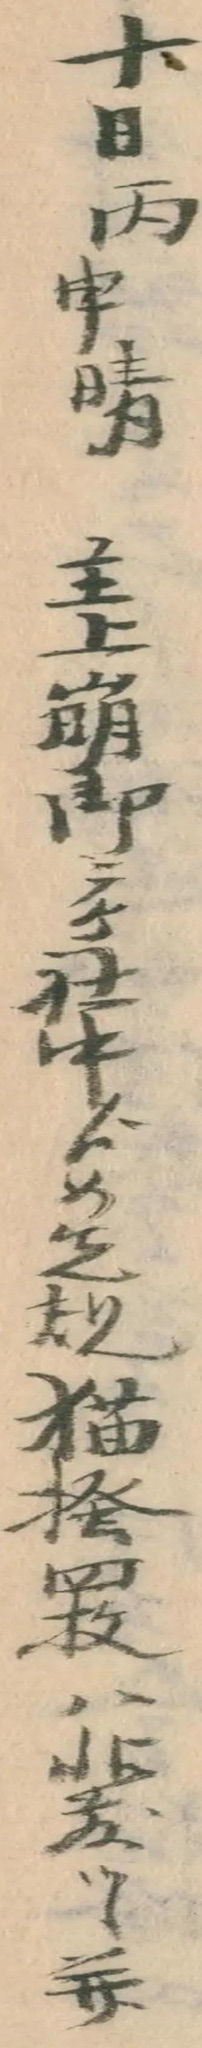十日丙申晴主上崩御ニ付社中ゟ如先規猫搔四枚ハ非敷ツヽ并
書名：賀茂社記録. 第70冊
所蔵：国立国会図書館 National Diet Library, JAPAN
